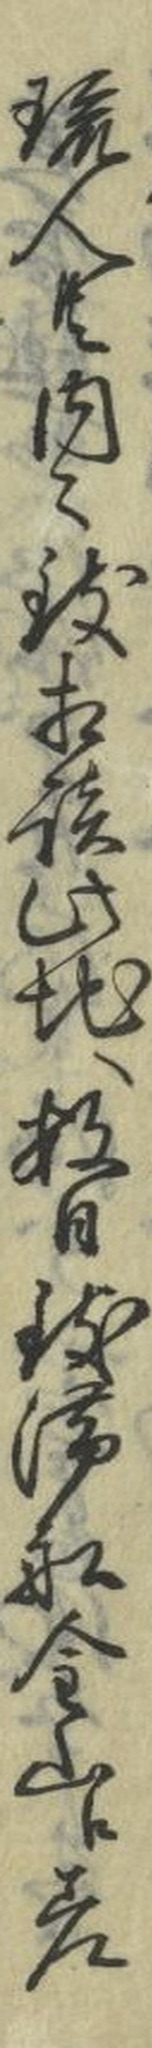琉人共内々致相談此地へ数日致滞船金山え差
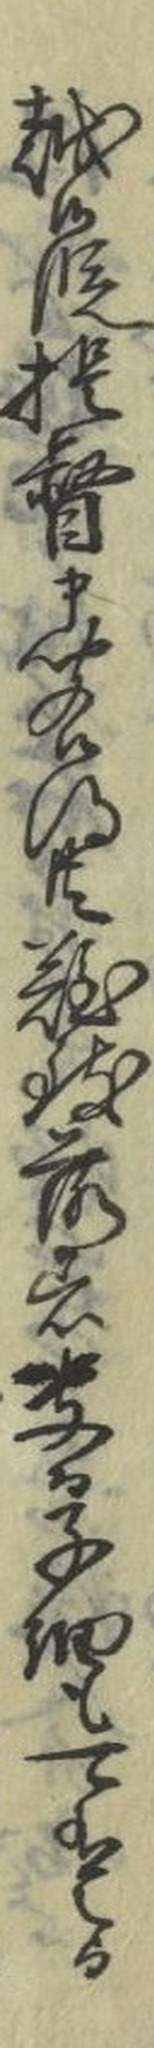越候段提督申聞候得共難致落着決而子細も可有之と
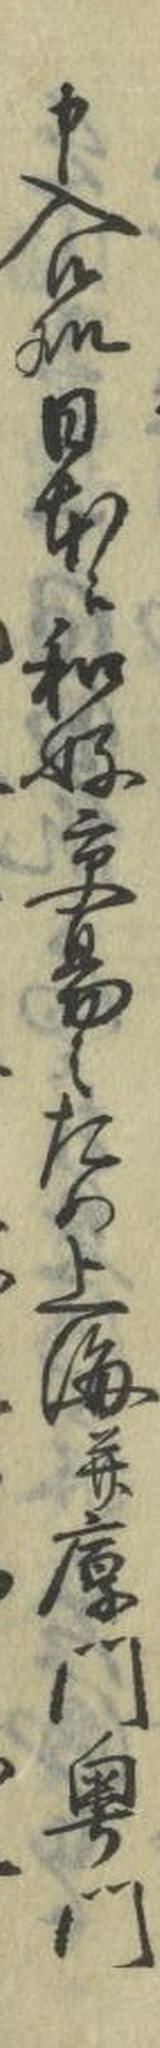申入候処日本え和好交易之ため上海幷厦門奥門
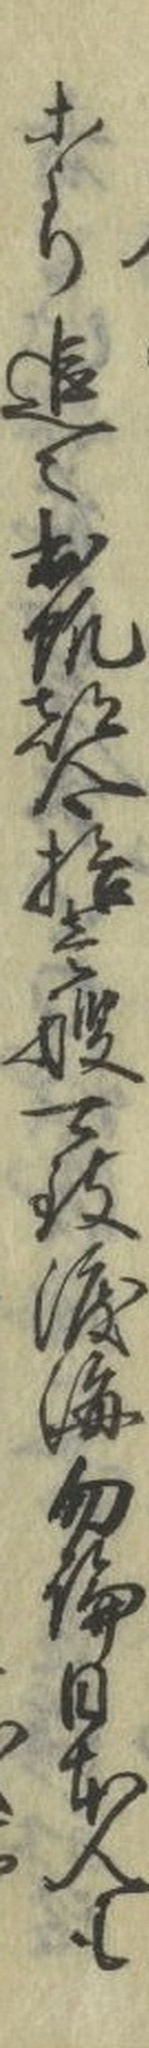等より追々出帆都合拾壱艘可致渡海勿論日本人も
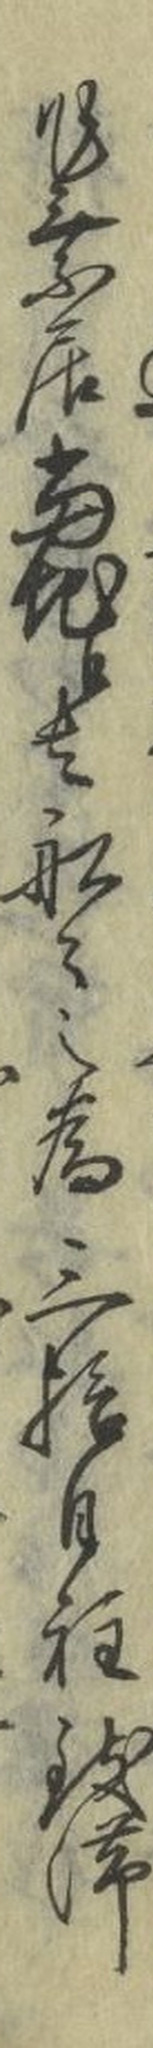乍乗居当地え其船々之為三拾日程致滞
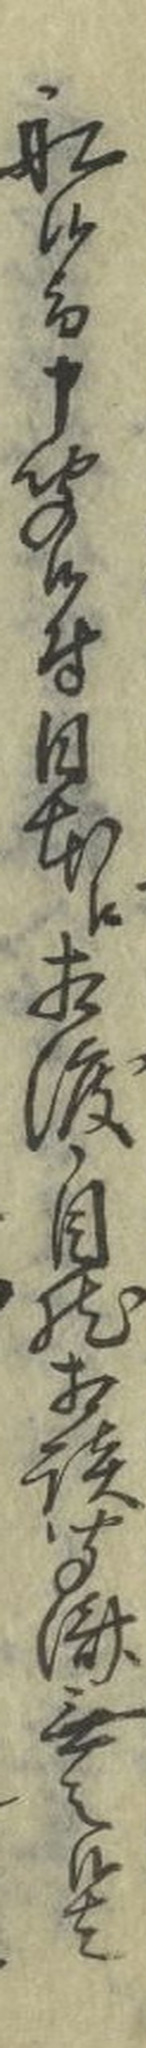船候旨申聞候付日本え相渡自然相談聞済無之候は
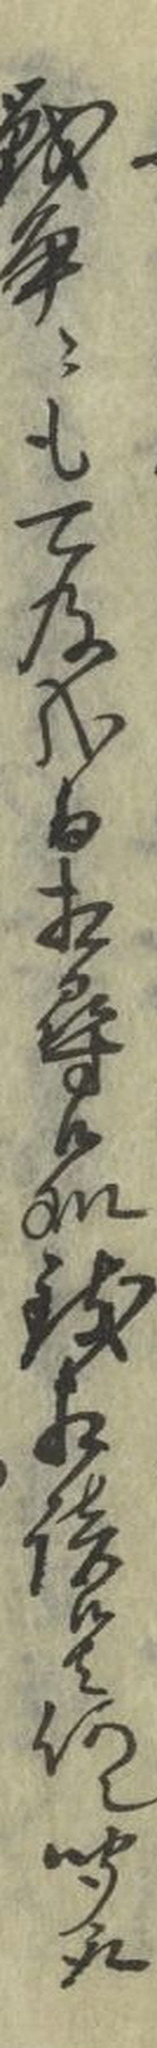戦争にも可及哉と相尋候処致相談候は何れ聞取
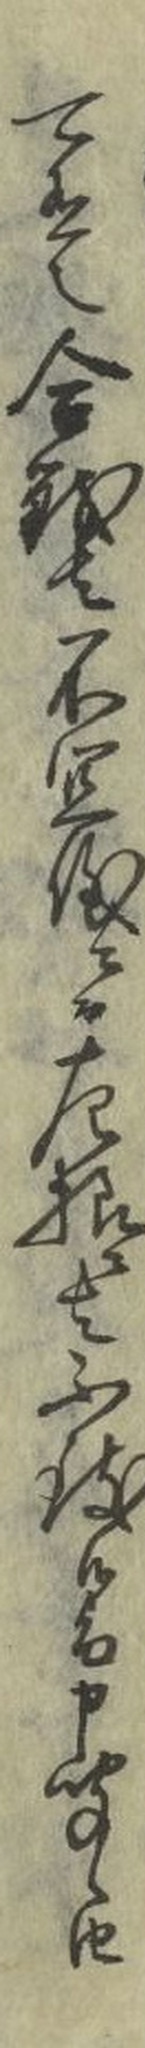可有之合戦は不宜儀に而左様には不致候旨申聞候由

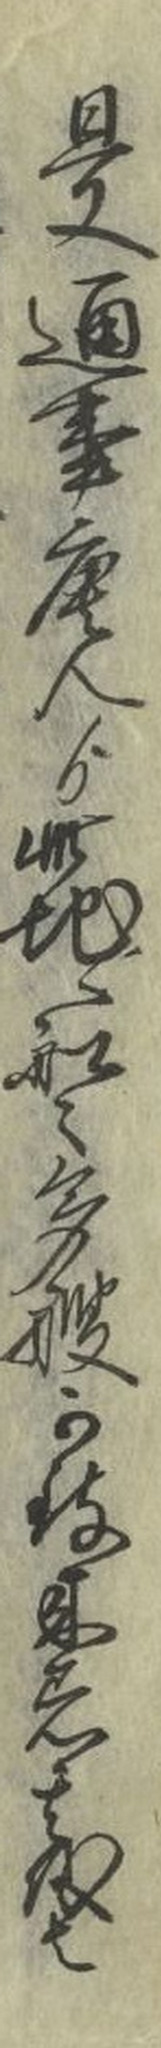且又通事唐人ゟ此地へ船々多艘可致来着其儀は
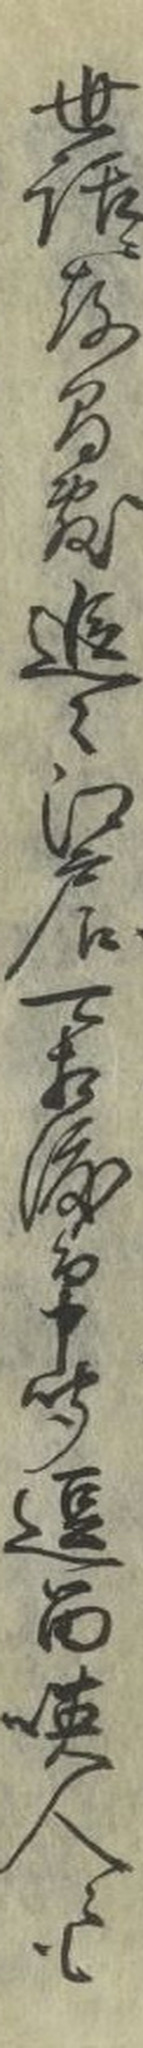世話に存間敷追々江戸え可相渡旨申聞逗留𠸄人にも
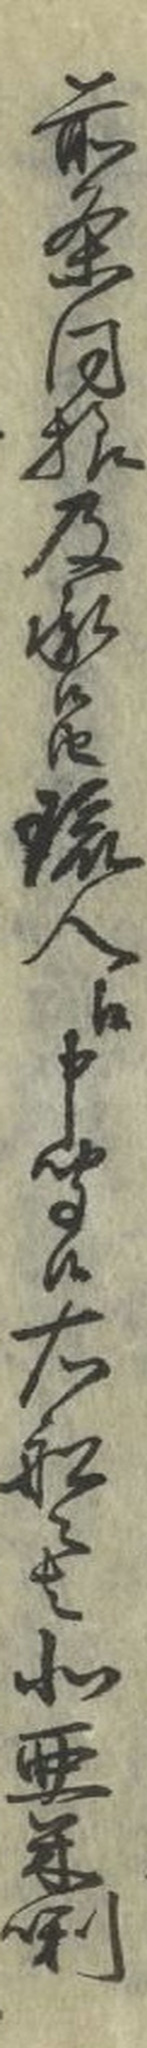前条同様及承候由琉人え申聞候右船には北亜米唎
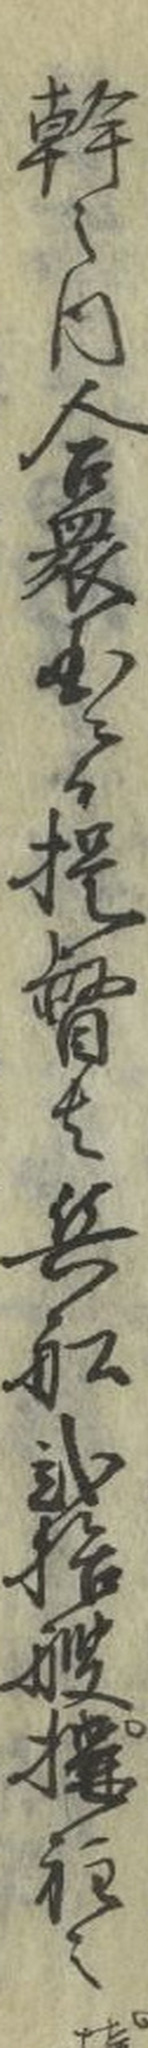幹之内合衆国に而提督は兵船弐拾艘構程之構
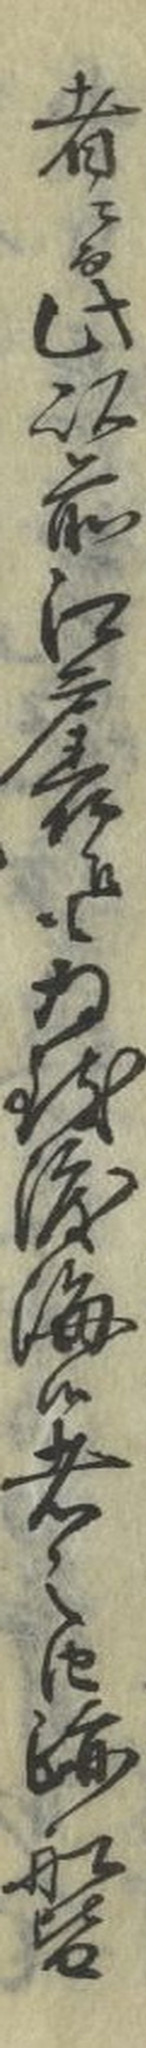者に而此以前江戸表えも為致渡海候者之由跡船皆
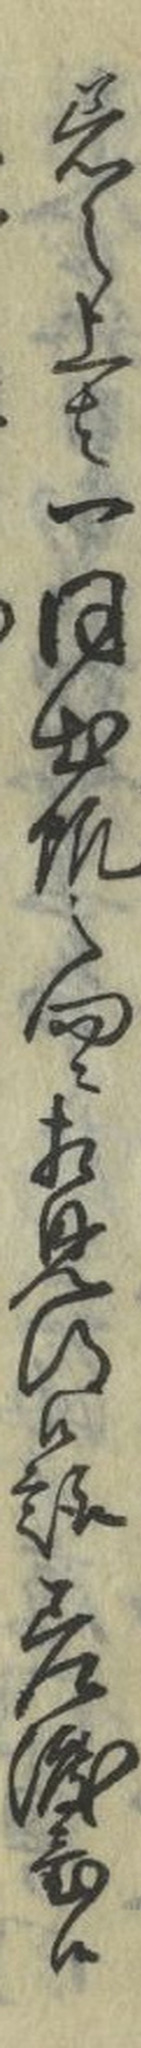着之上は一同出帆之向に相見得候趣差渡置候
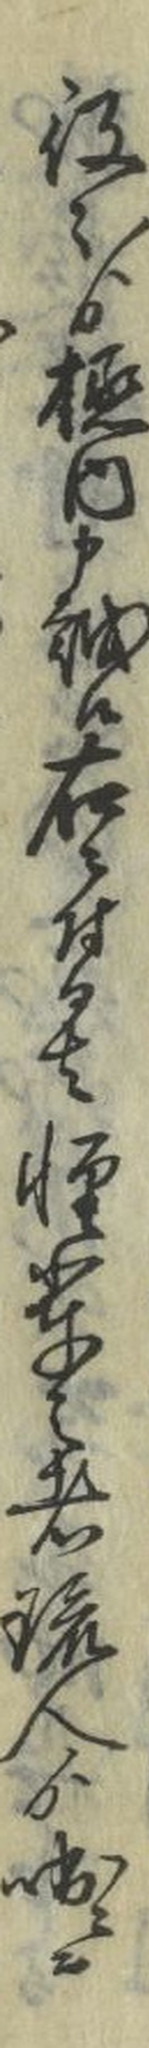役々ゟ極内申越候右に付而は軽輩之者琉人ゟ咄に而
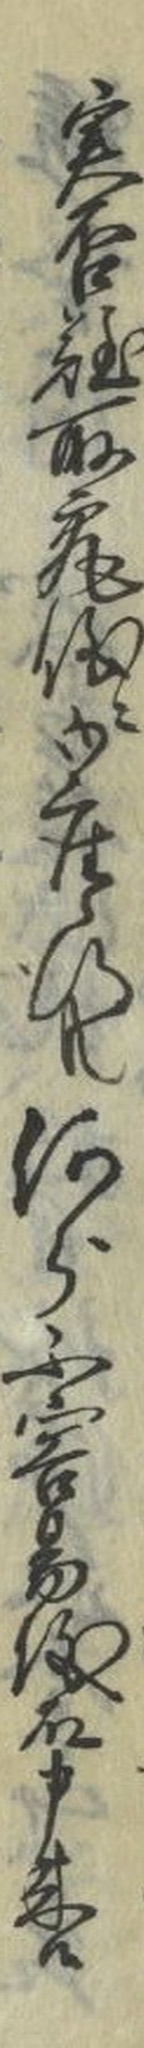実否難取究儀に御座候得共何分不容易儀故申来候
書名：琉球へアメリカ船渡来書
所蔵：University of the Ryukyus Library
